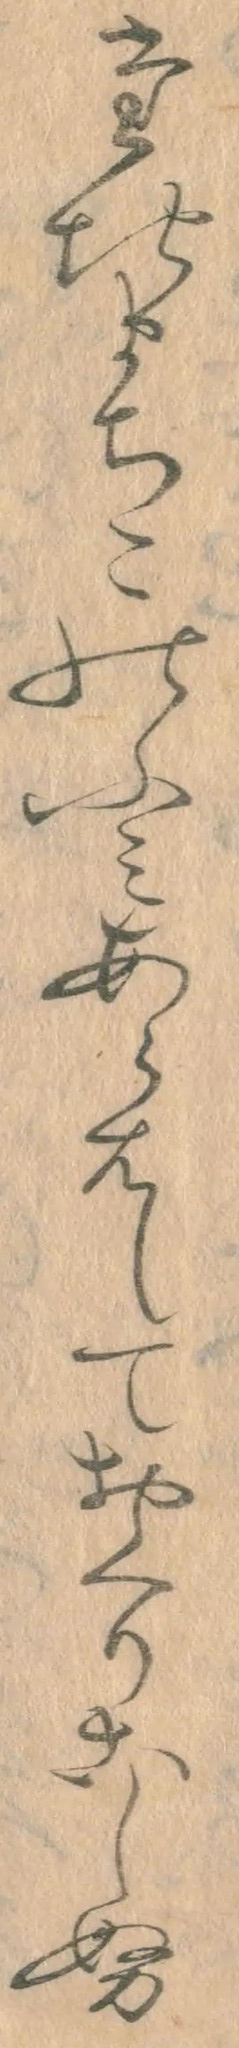たちまちこのふみあらはしておくりこしぬ
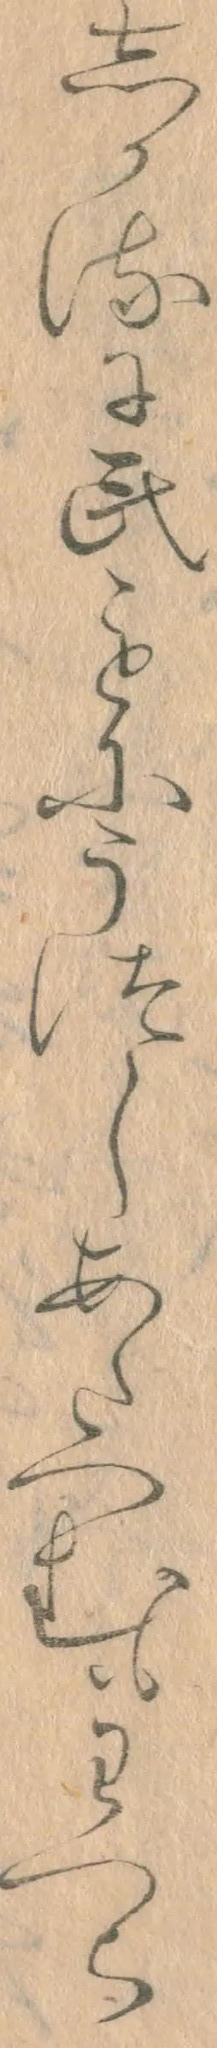しかるに民ことにうつしあたへむもわつら
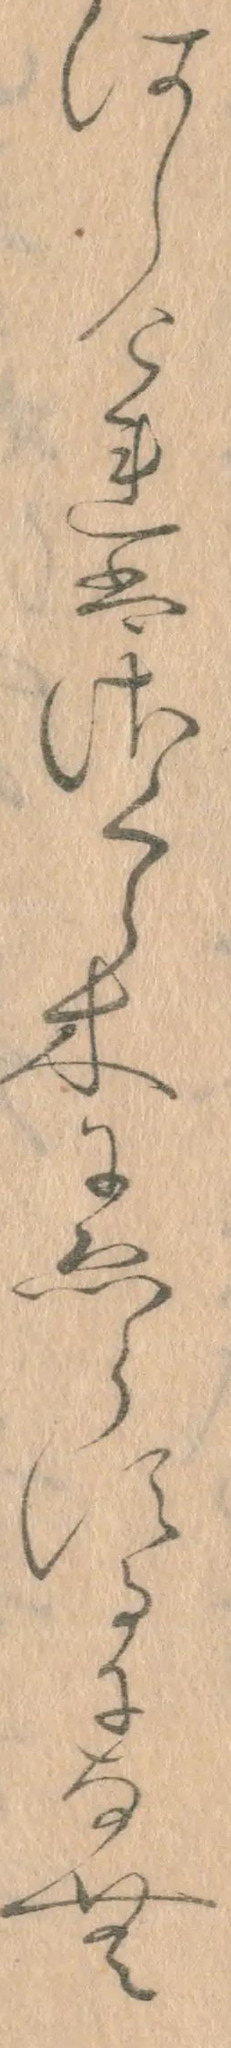はしけれはさくら木にゑらするになむ
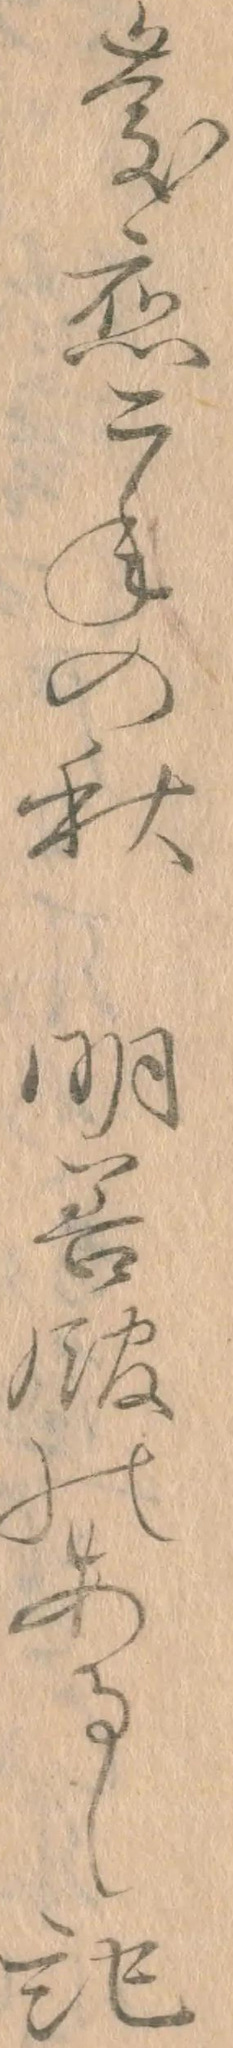慶応二年の秋明善館のあるし記
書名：蚕茶并紙木植方書
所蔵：国立国会図書館 National Diet Library, JAPAN
